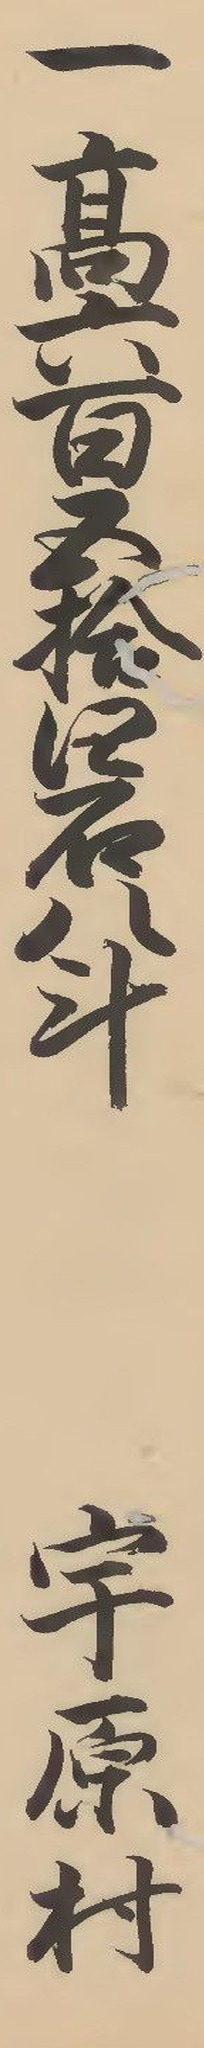一髙六百五拾四石八斗宇原村
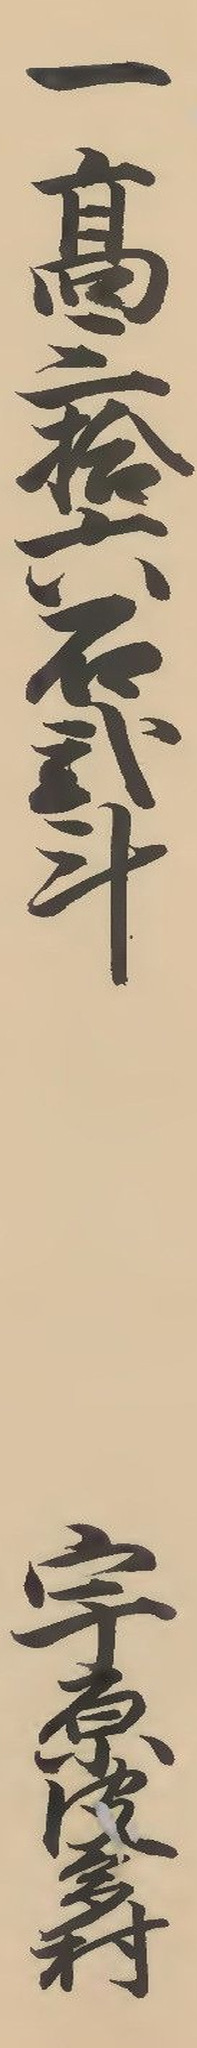一髙三拾六石弐斗宇原皮多村
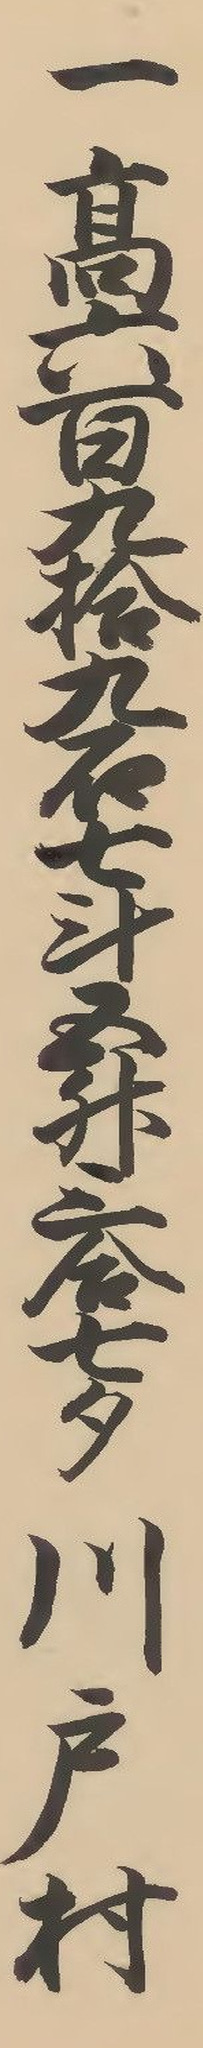一髙六百九拾九石七斗五升三合七夕川戸村
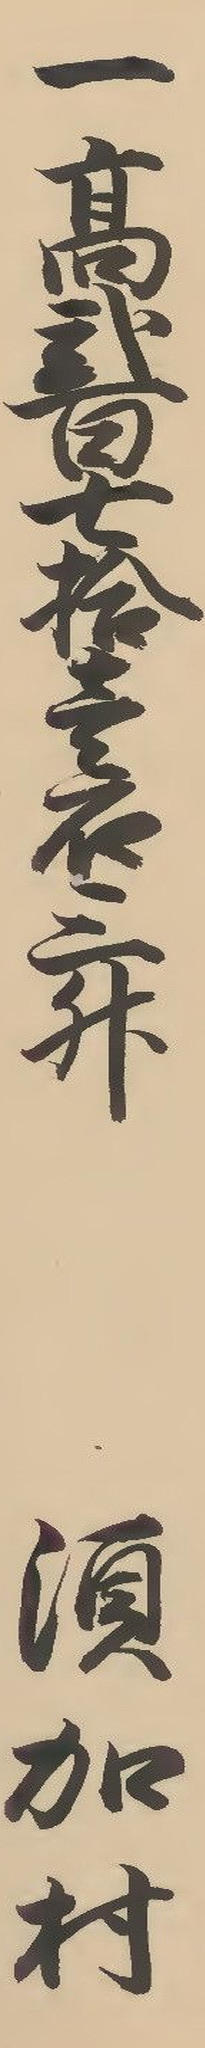一髙弐百七拾壱石三升須加村
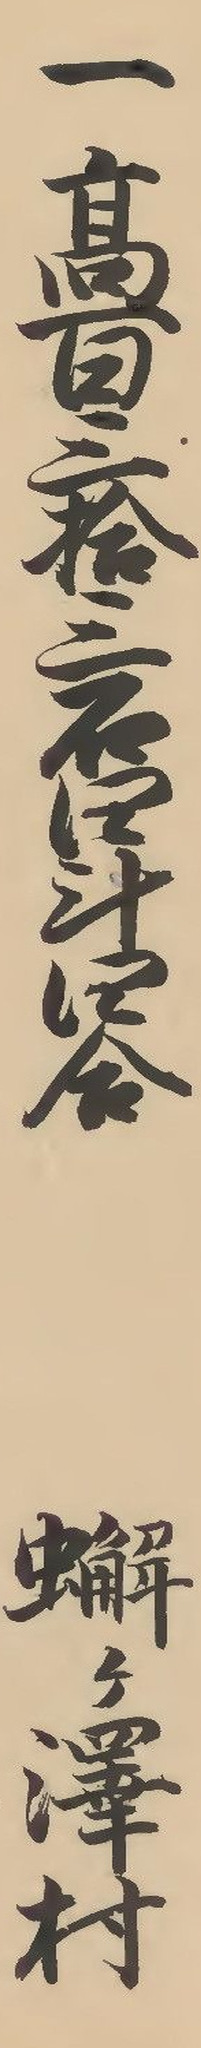一髙百三拾三石四斗四合蠏ケ澤村
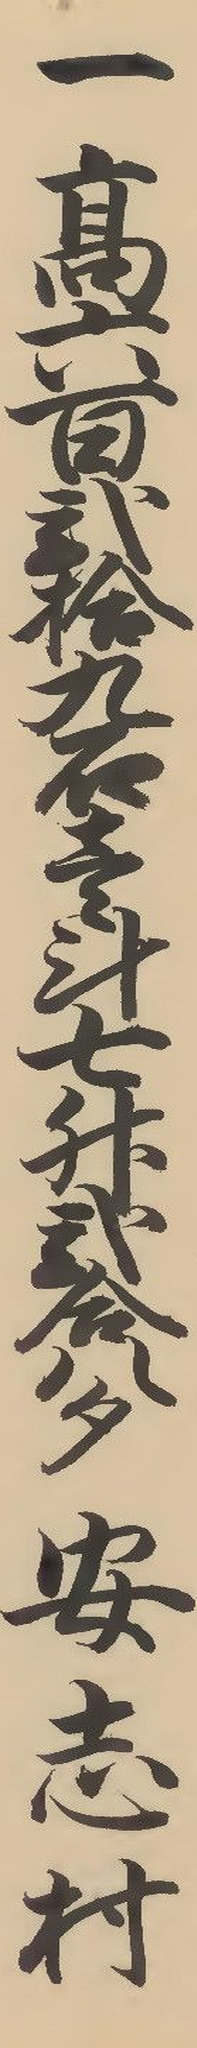一髙六百弐拾九石壱斗七升弐合八夕安志村
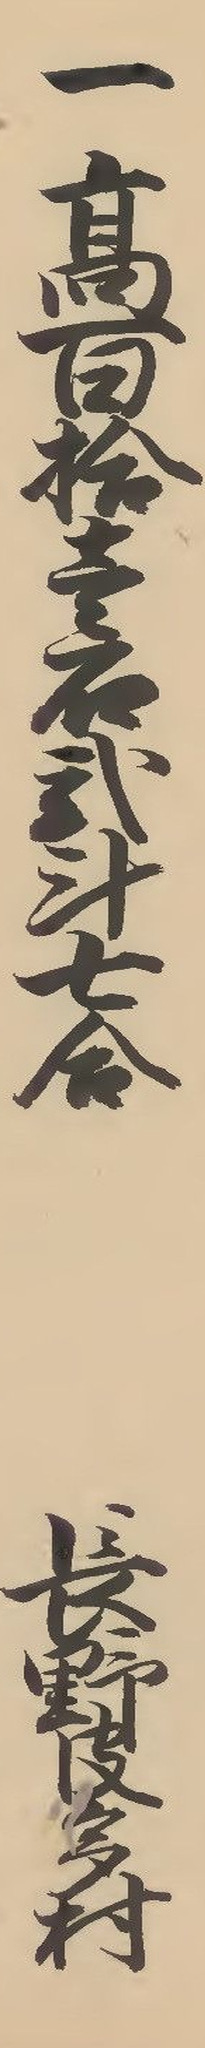一髙百拾壱石弐斗七合長野皮多村
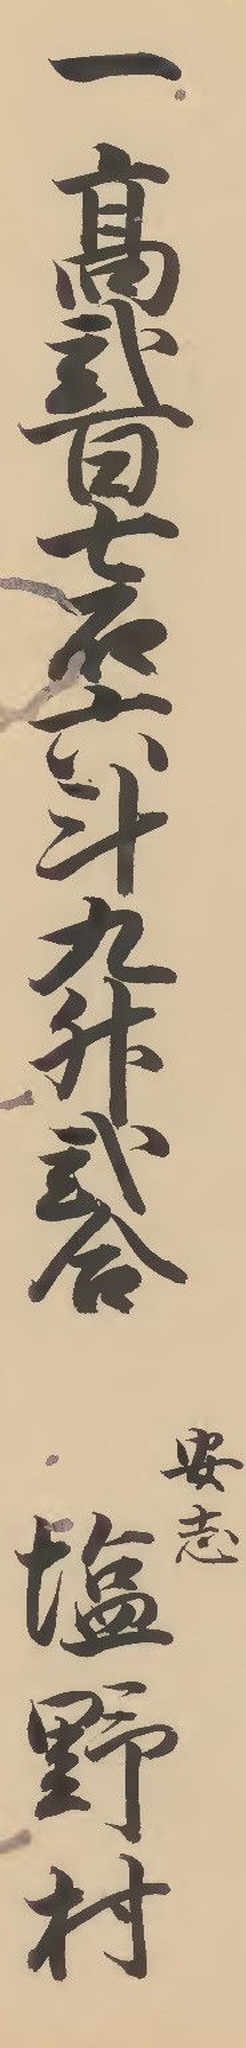一髙弐百七石六斗九升弐合塩野村

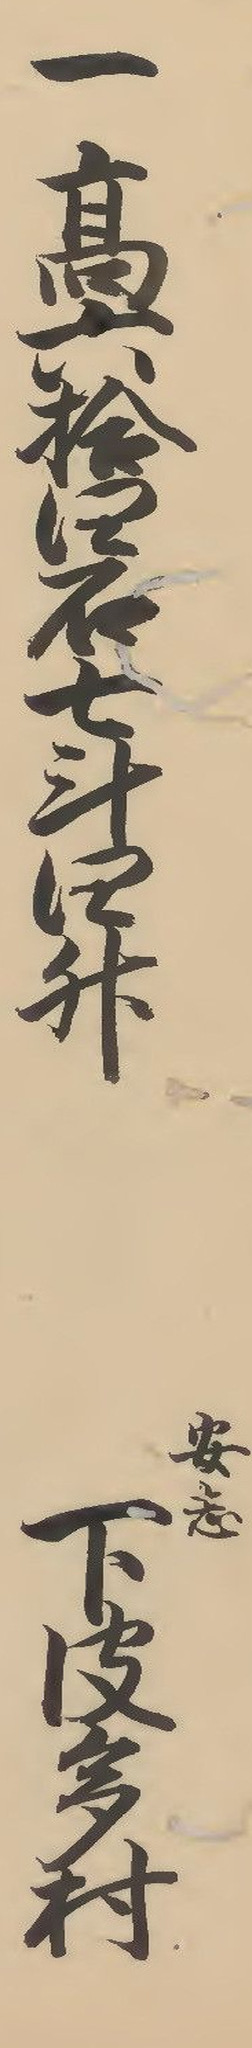一髙六拾四石七斗四升下皮多村
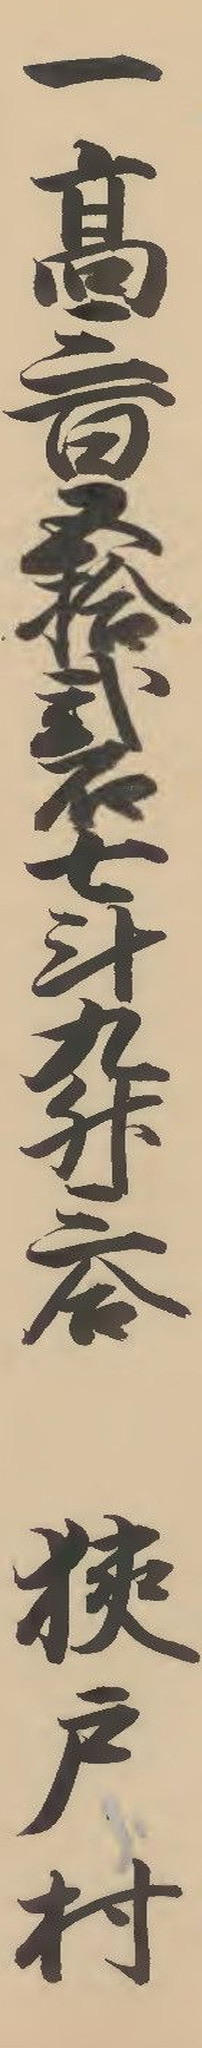一髙三百五拾弐石七斗九升三合狹戸村
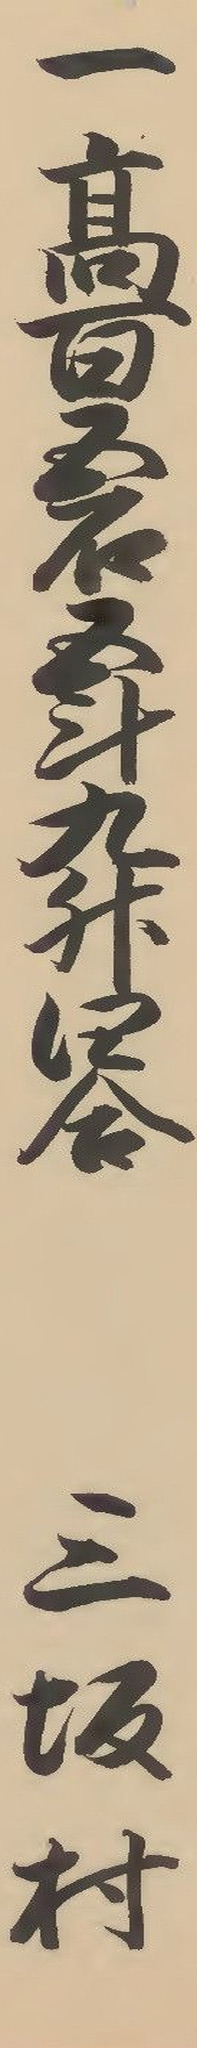一髙百五石五斗九升四合三坂村
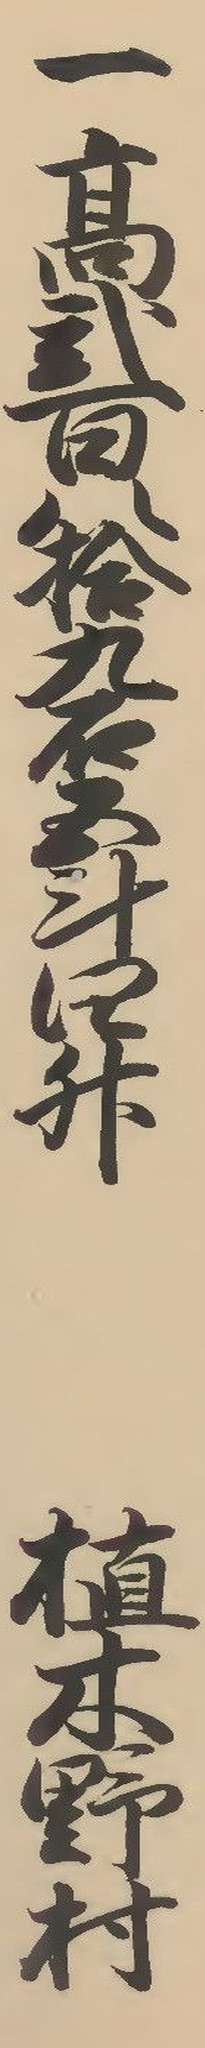一髙弐百八拾九石五斗四升植木野村
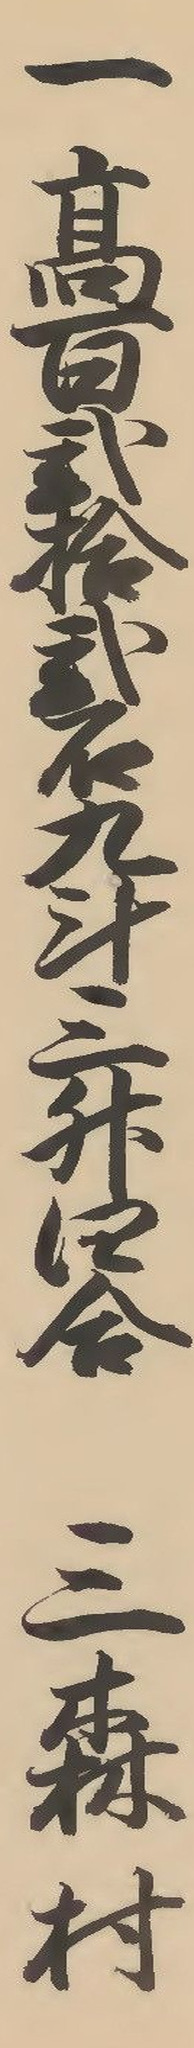一髙百弐拾弐石九斗三升四合三森村
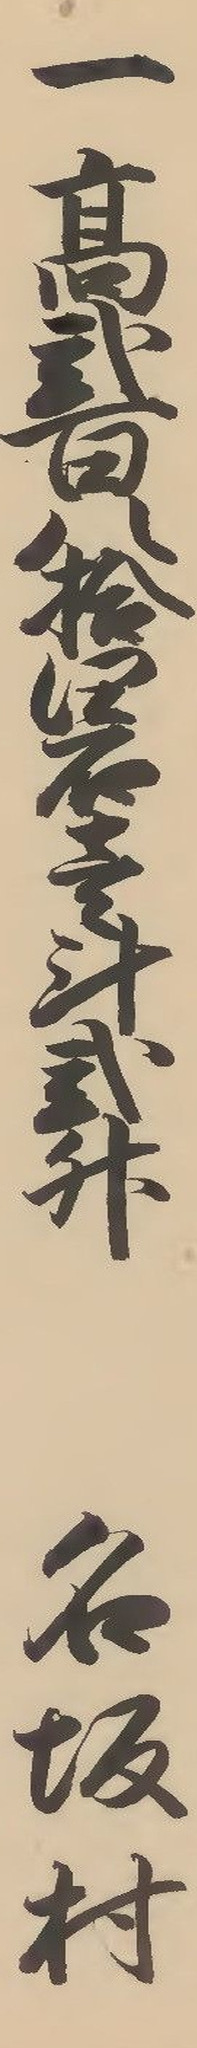一髙弐百八拾四石壱斗弐升名坂村
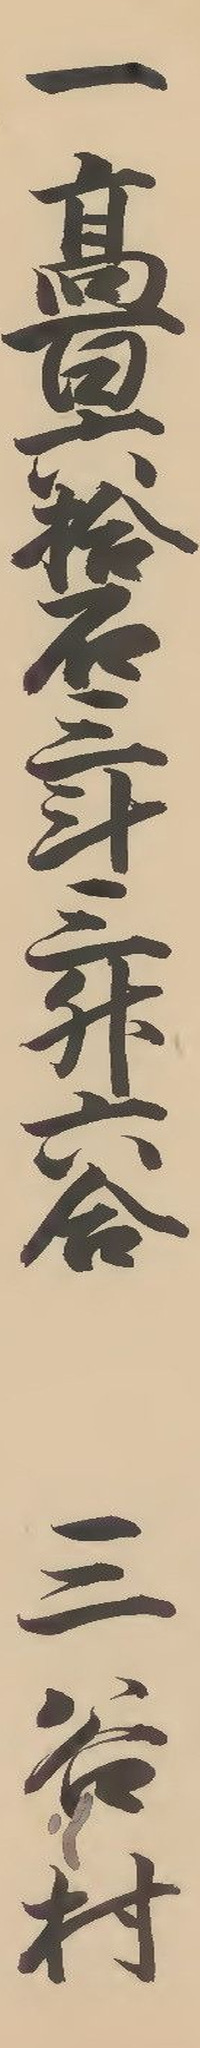一髙百六拾石三斗三升六合三谷村
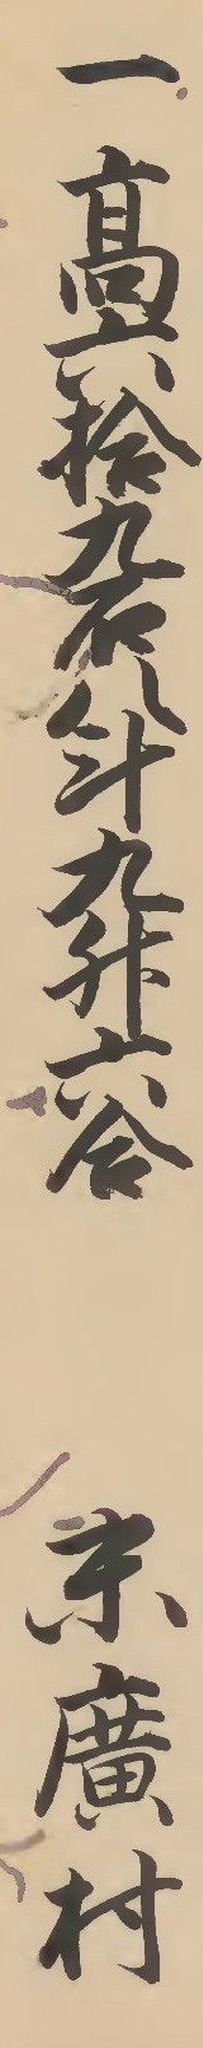一髙六拾九石八斗九升六合末廣村
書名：播磨国郷帳
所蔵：国立公文書館 National Archives of Japan
